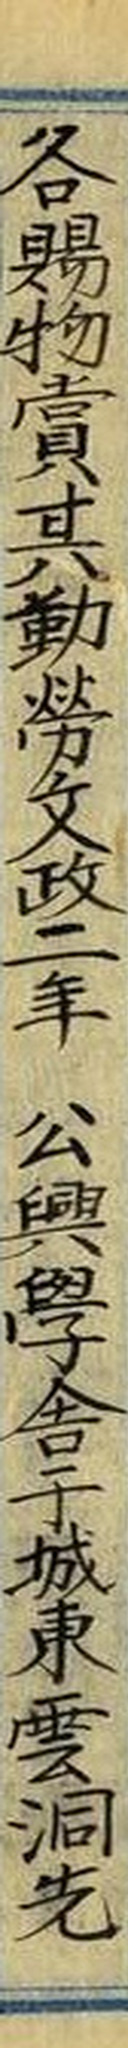各賜物賞其勤勞文政二年公興學舎于城東雲洞先
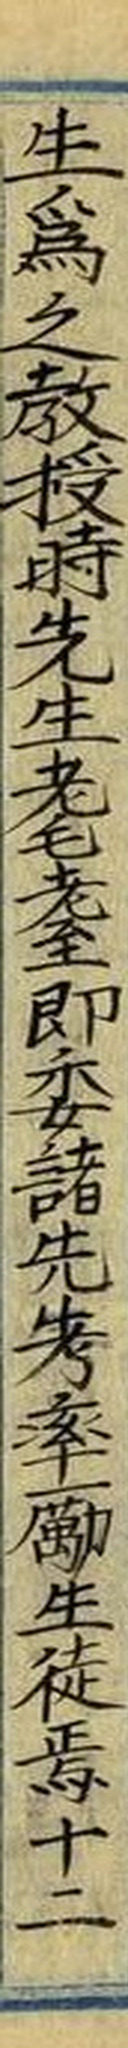生爲之教授時先生耄耋即委諸先考率勵生徒焉十二
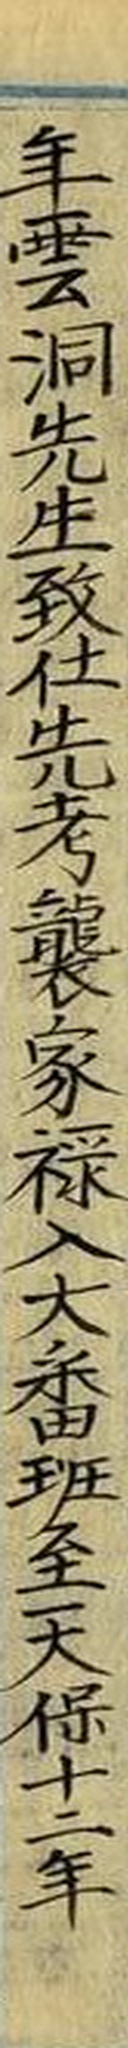年雲洞先生致仕先考襲家禄入大番班至天保十二年
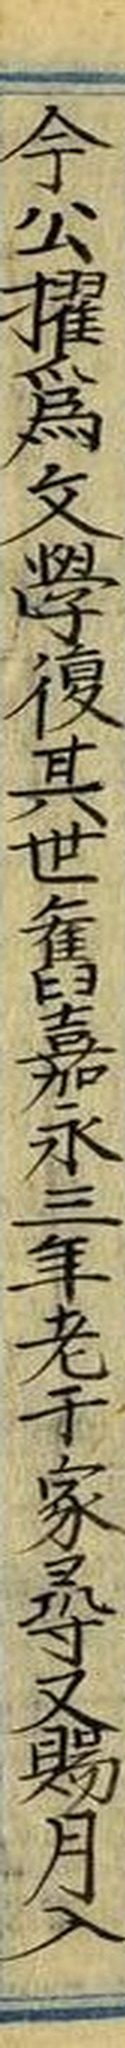今公擢爲文學復其世舊嘉永三年老于家尋又賜月入
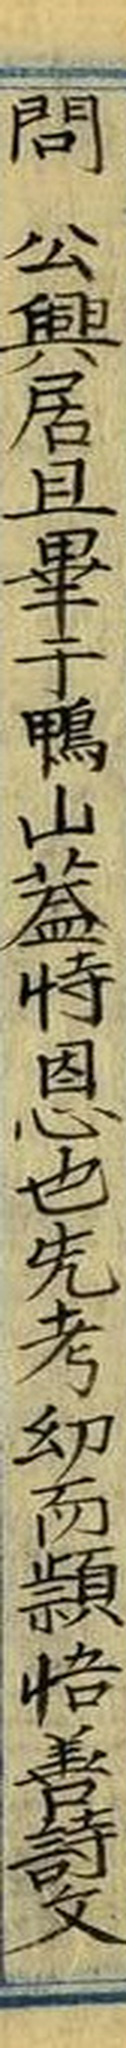問公興居且畢于鴨山葢特恩也先考幼而穎悟善詩文
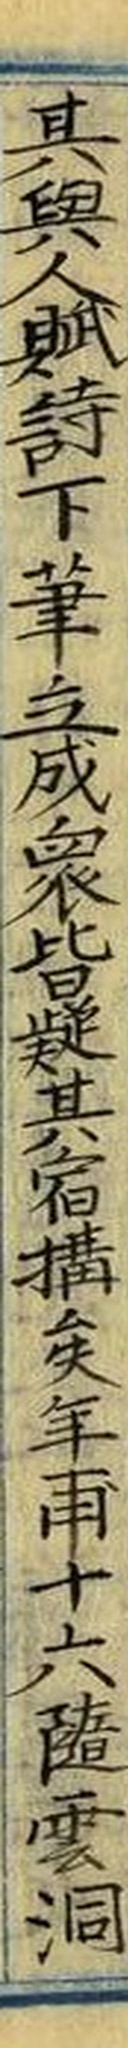其與人賦詩下茟立成衆皆疑其宿搆矣年甫十六隨雲洞
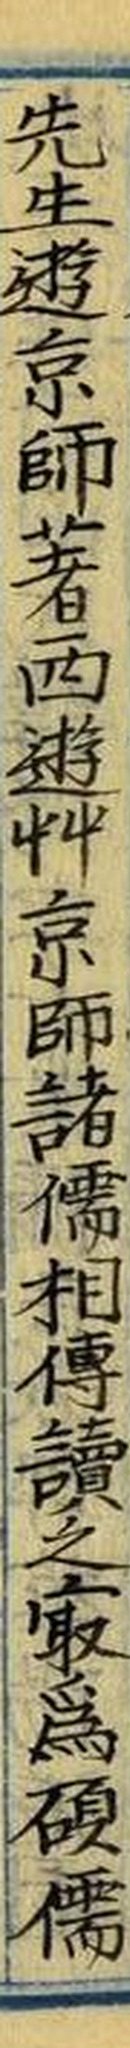先生遊京師著西遊艸京師諸儒相傳讀之㝡爲碩儒
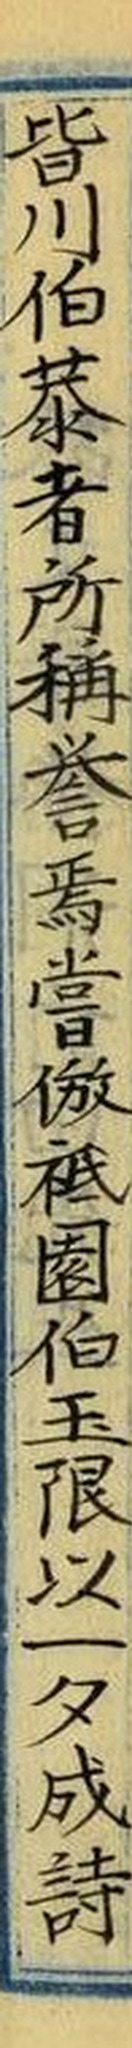皆川伯恭者所稱誉焉嘗倣祗園伯玉限以一夕成詩
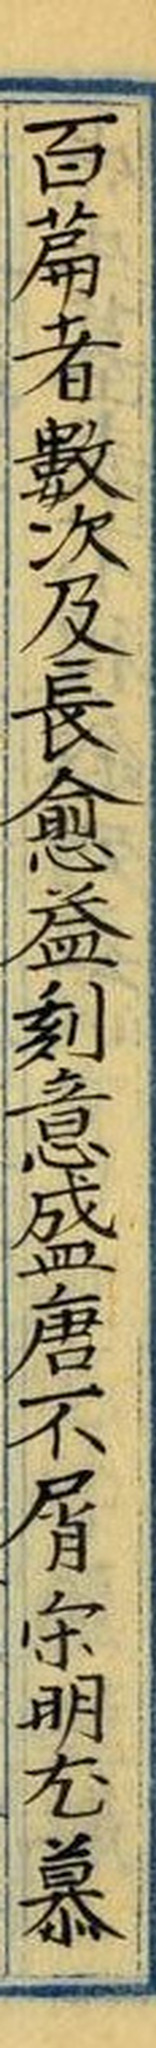百萹者數次及長愈益刻意盛唐不屑宋明尤慕
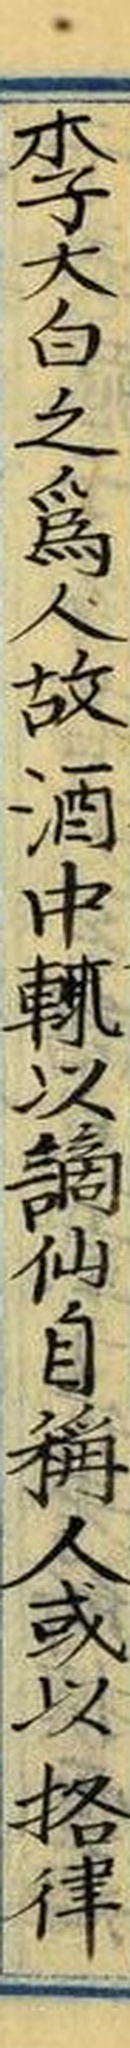李大白之爲人故酒中輒以謫仙自稱人或以挌律
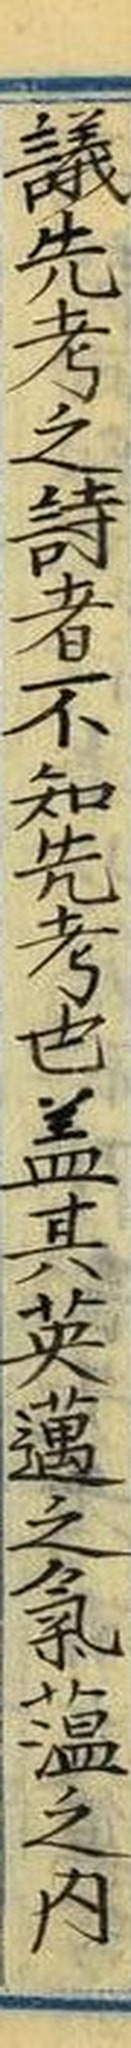議先考之詩者不知先考也盖其英邁之氣薀之内
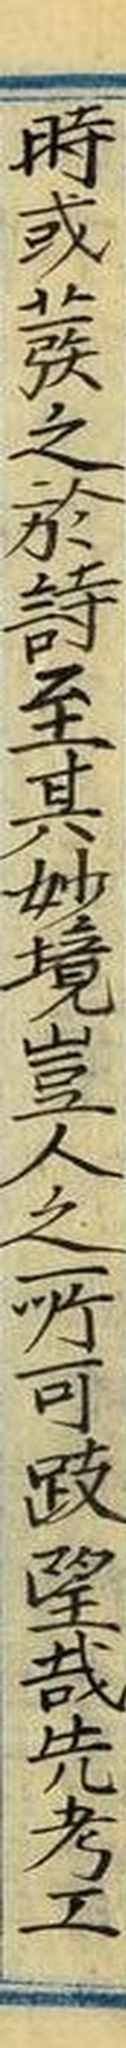時或彂之於詩至其妙境豈人之所可跂望哉先考工
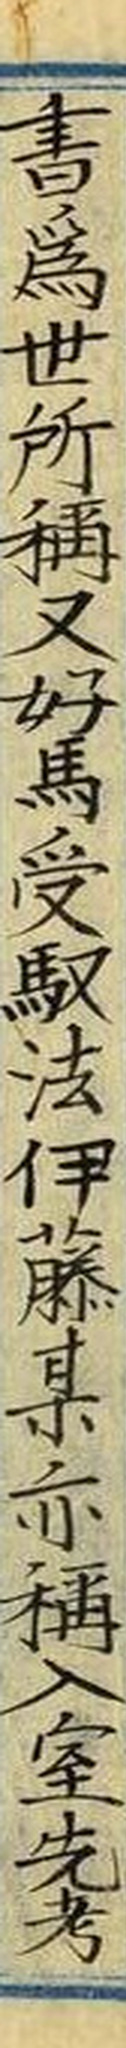書爲世所稱又好馬受馭法伊藤某亦稱入室先考
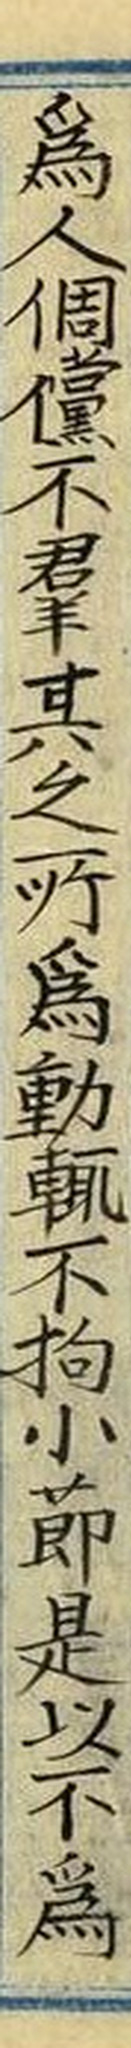爲人倜儻不羣其之所爲動輒不拘小莭是以不爲
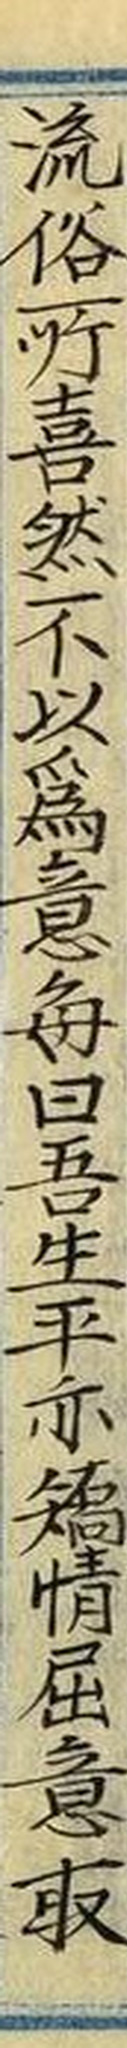流俗所喜然不以爲意毎曰吾生平亦矯情屈意取
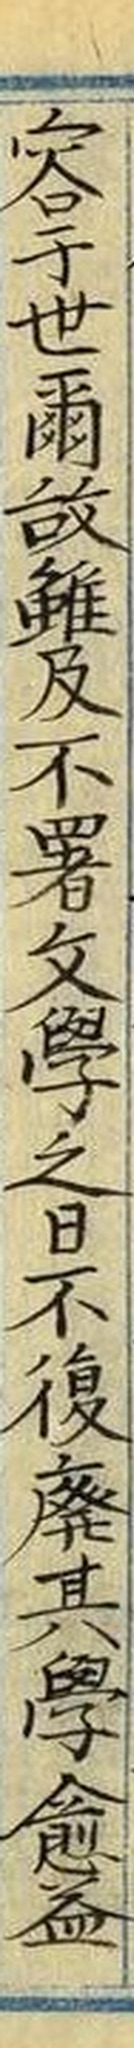容于世爾故雖及不署文學之日不復廃其學愈益
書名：温古集 四巻
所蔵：福井県文書館 Fukui Prefectural Archives
